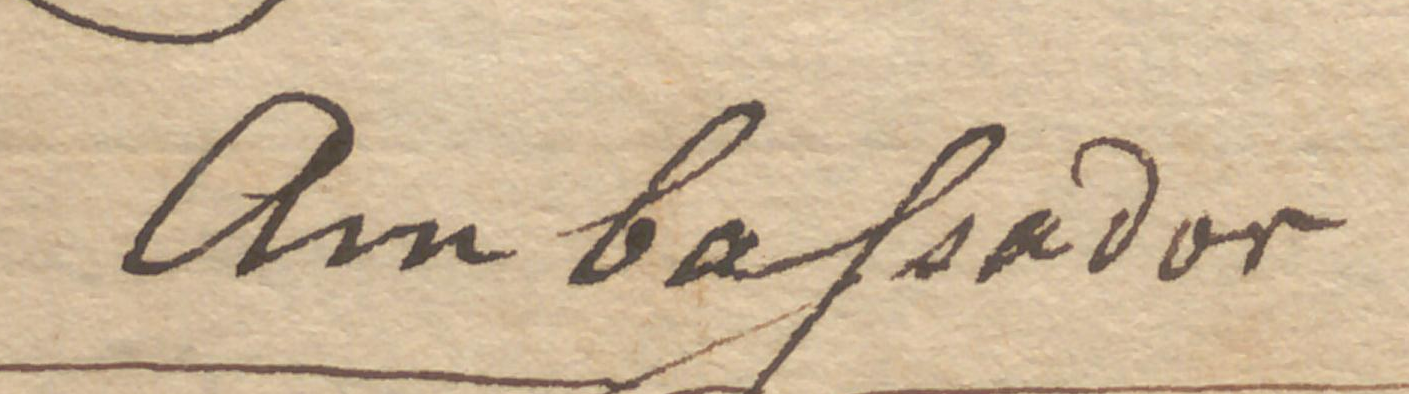Ambassador
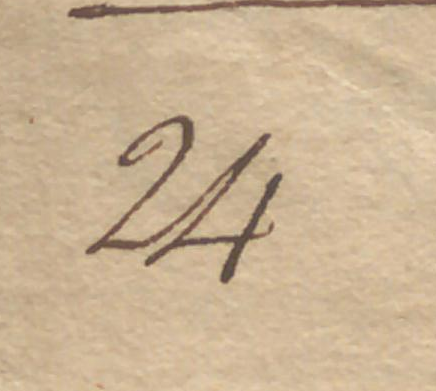24
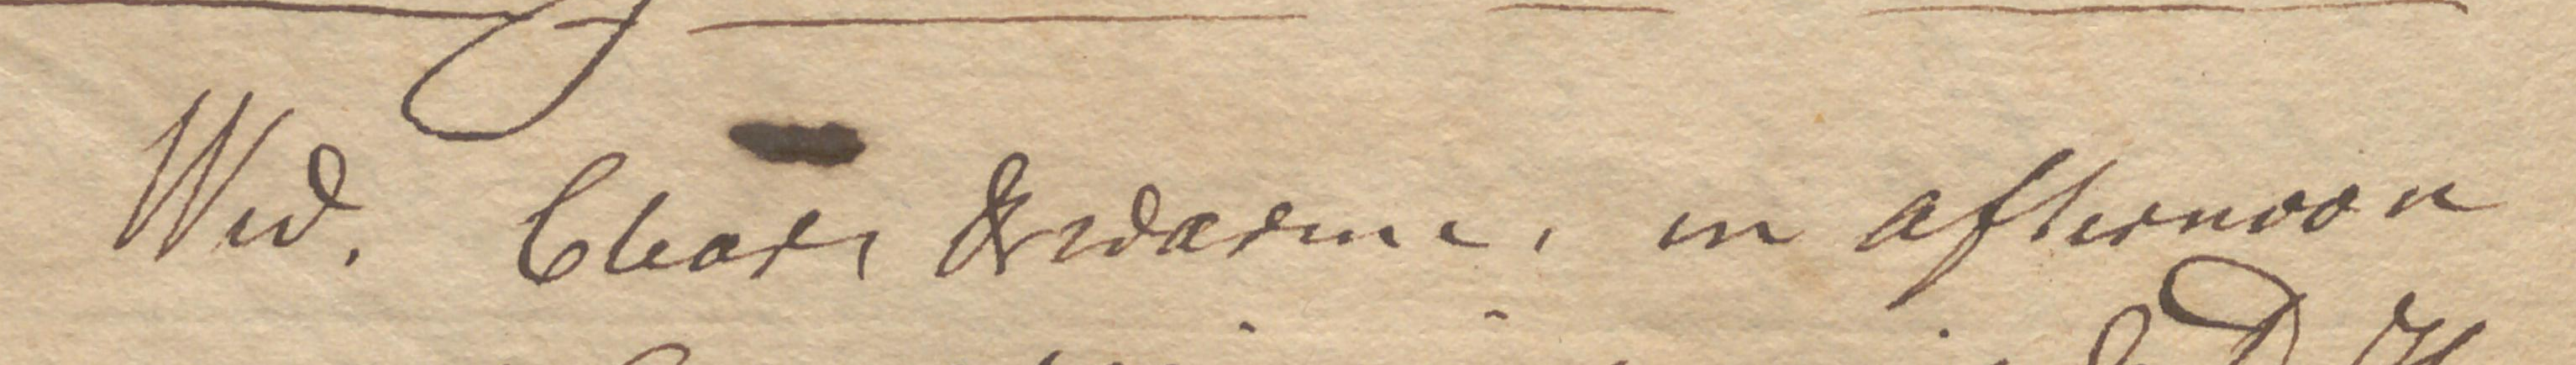Wed. Clear &warme, in afternoon
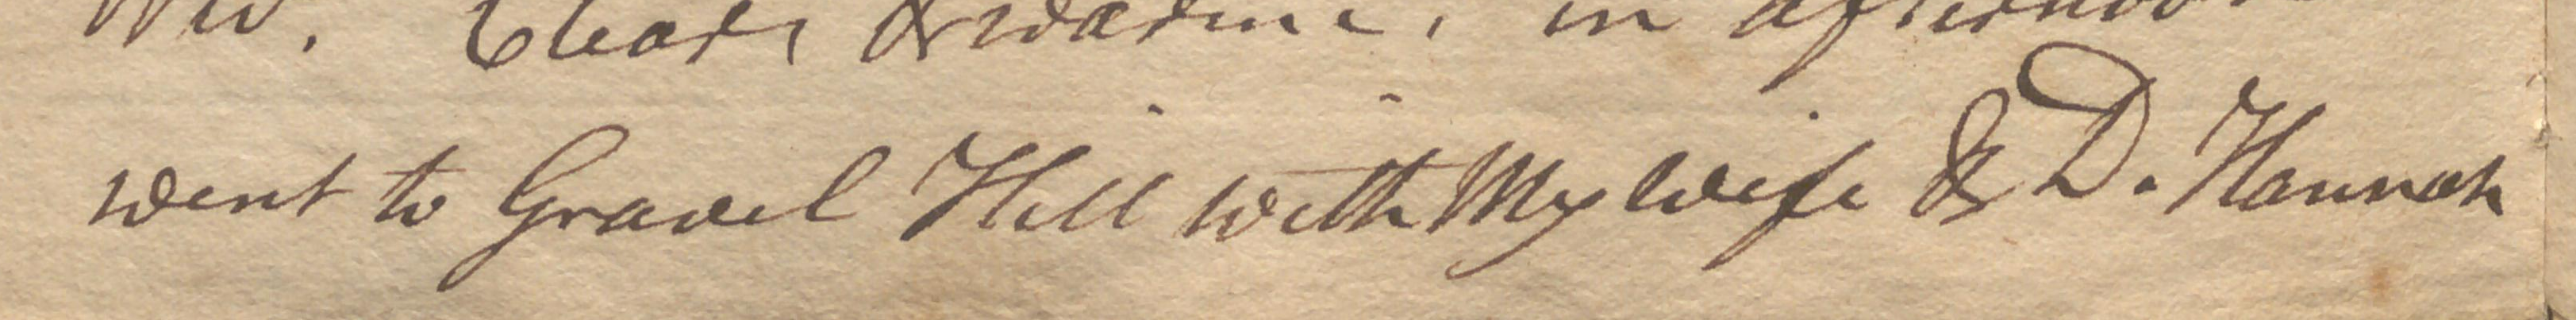went to Gravel Hill with My wife & D. Hannah
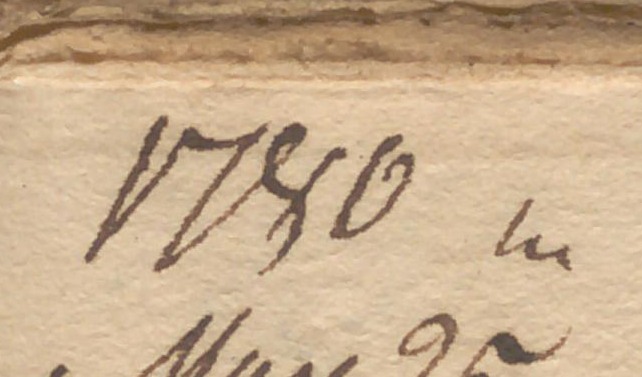1780
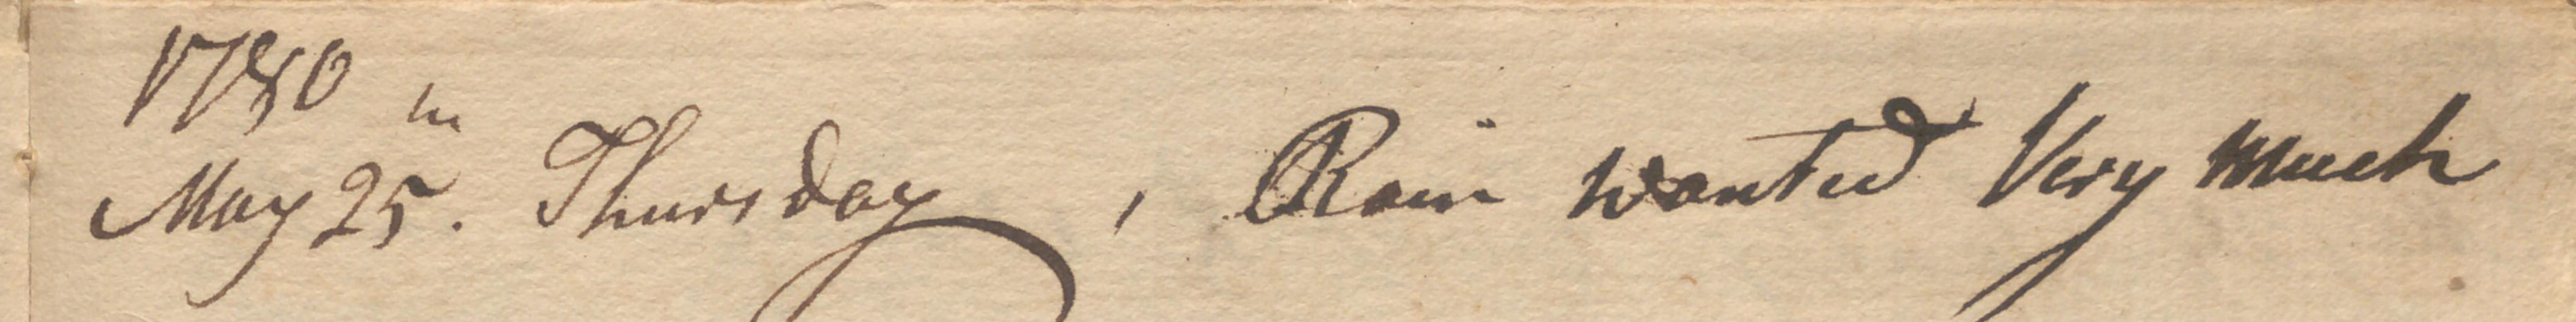May 25^th. Thursday. Rain wanted Very Much
